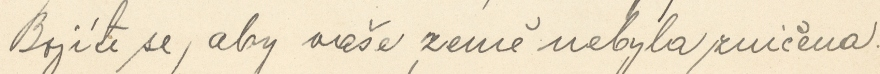Bojíte se, aby vaše země nebyla zničena.
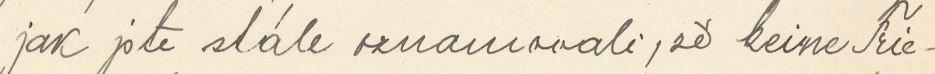jak jste stále oznamovali, že keine Frie-
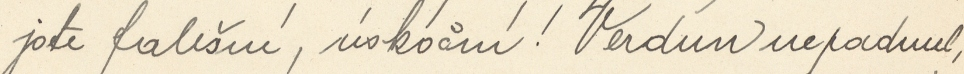jste falešní, úskoční! Verdun nepadnul,
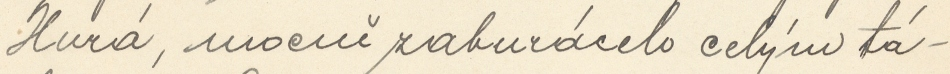Hurá, mocně zaburácelo celým tá-
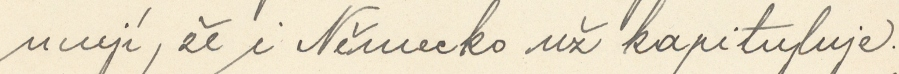mují, že i Německo už kapituluje.
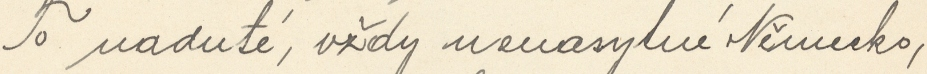To naduté, vždy nenasytné Německo,
